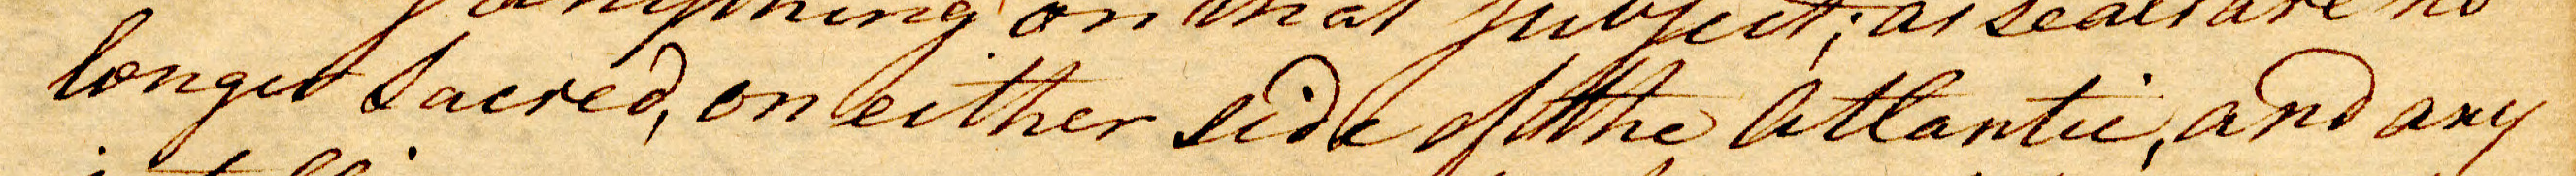longer sacred, on either side of the Atlantic, and any
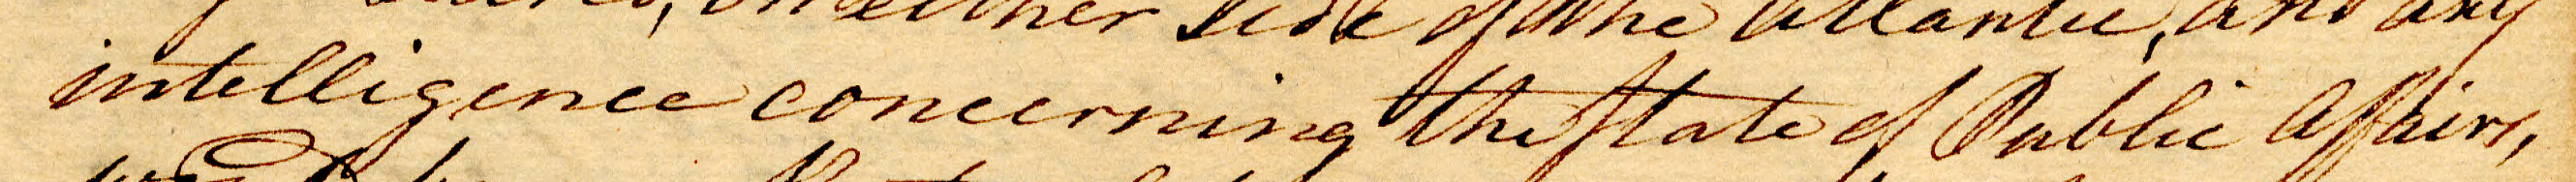intelligence concerning the State of Public Affairs,
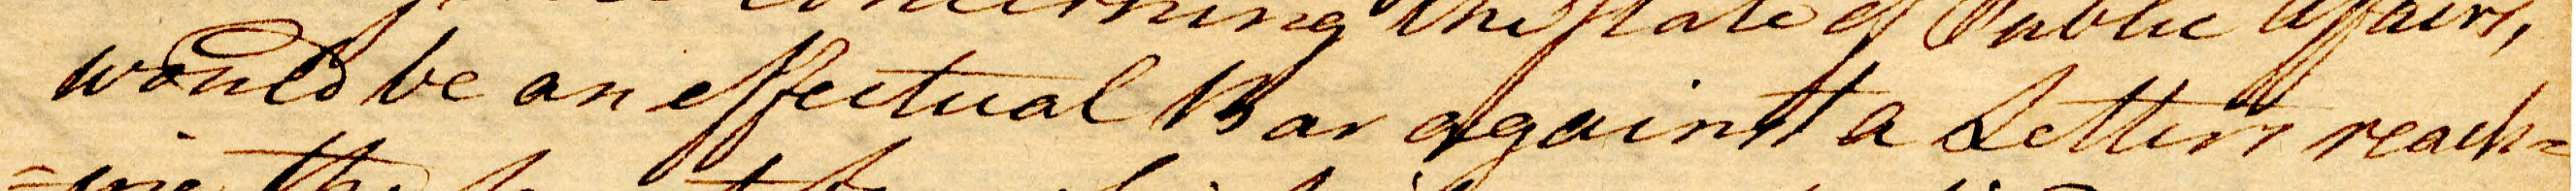would be an effectual Bar against a Letters reach-
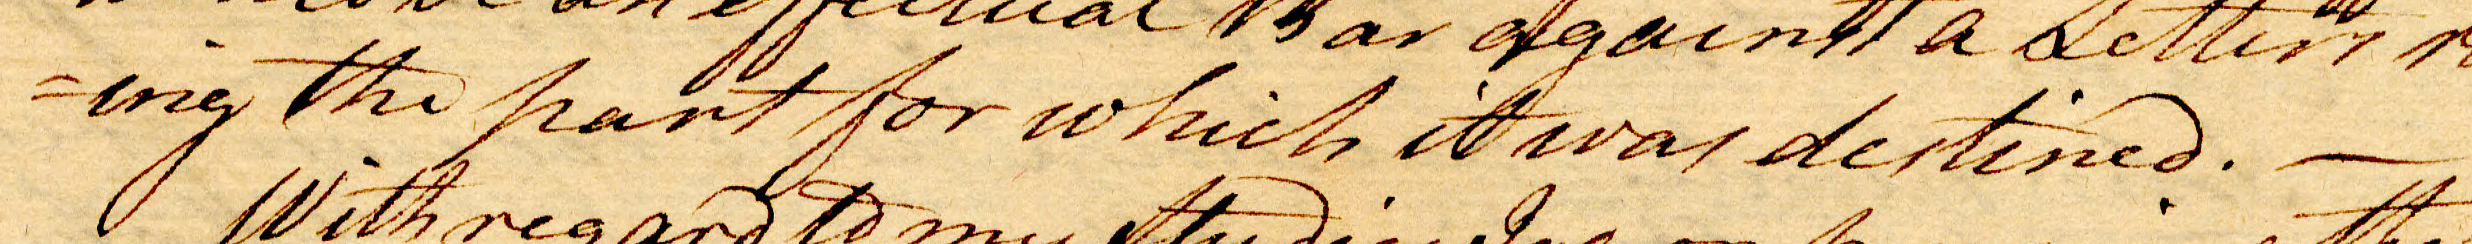-ing the part for which it was destined.-
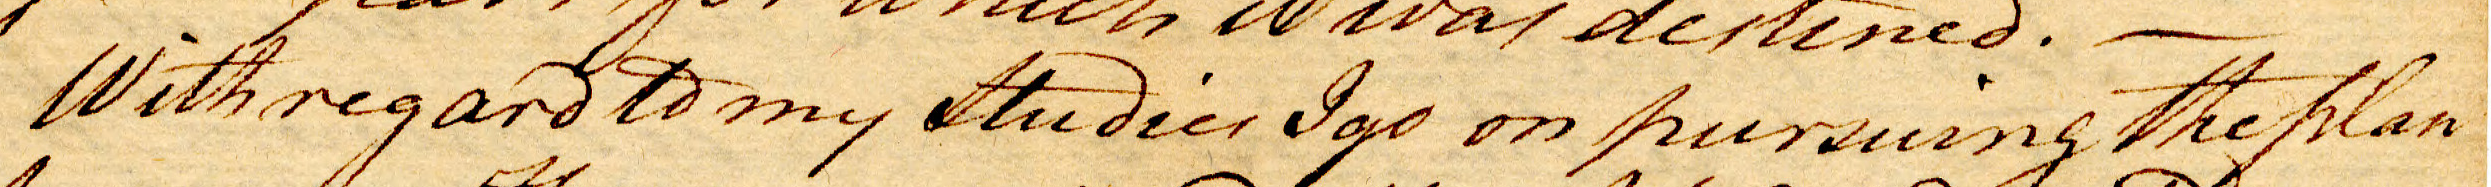With regard to my Studies, I go on pursuing the plan
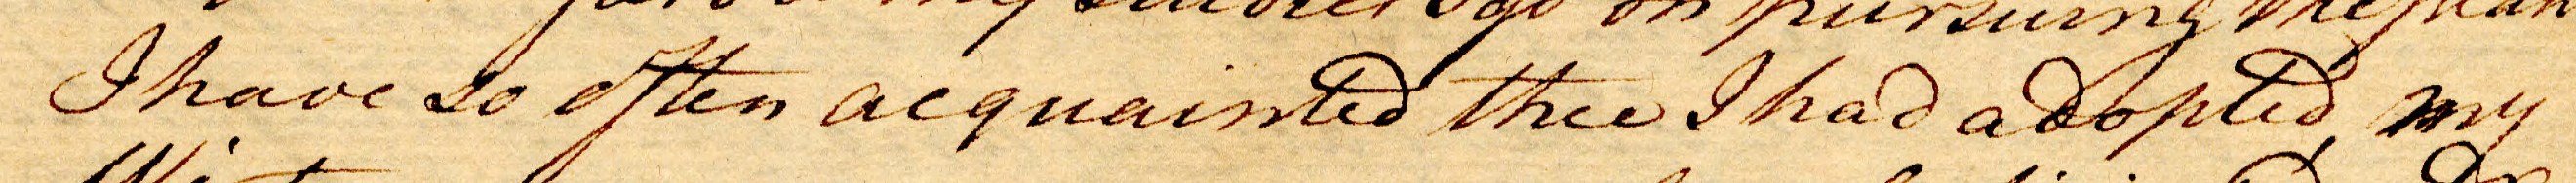I have so often acquainted thee I had adopted, my
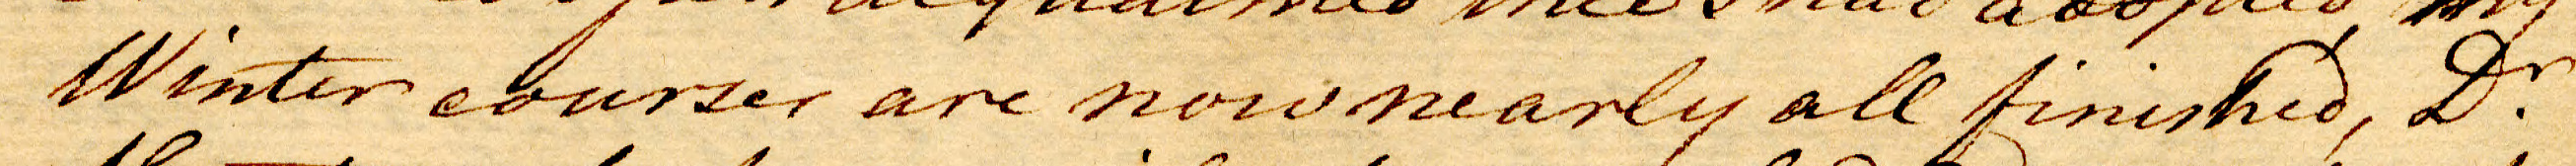Winter courses are now nearly all finished, D^r.
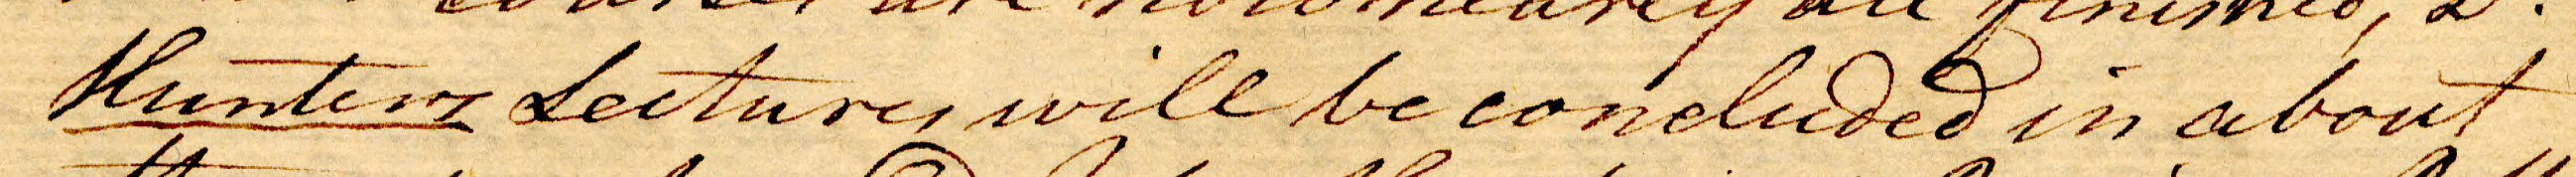Hunters Lectures will be concluded in about
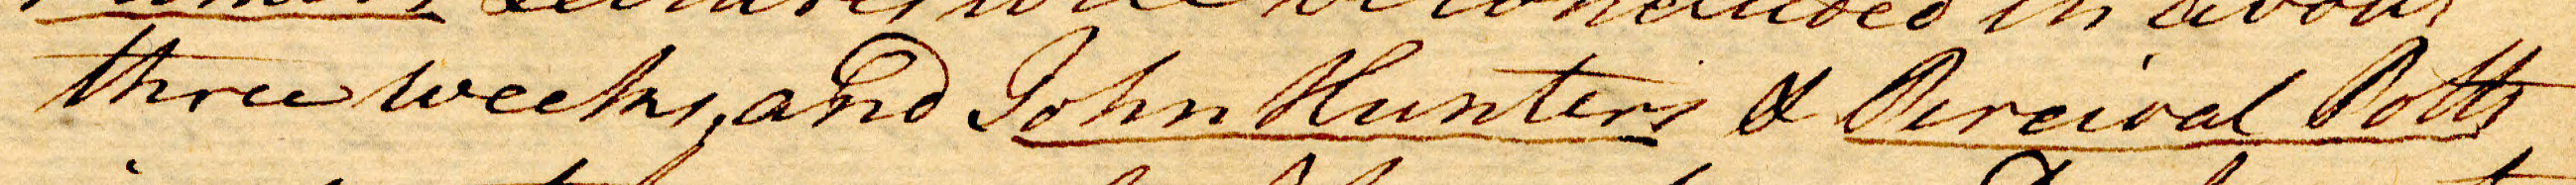three weeks, and John Hunters & Percival Potts
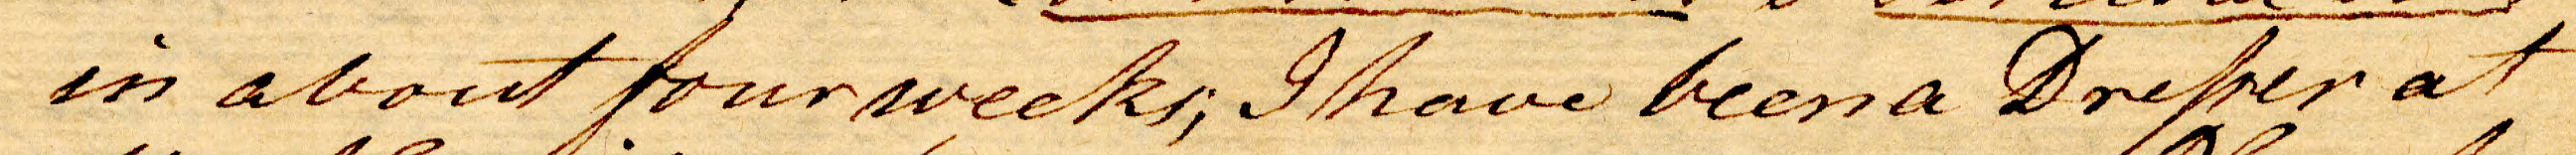in about four weeks; I have been a Dresser at
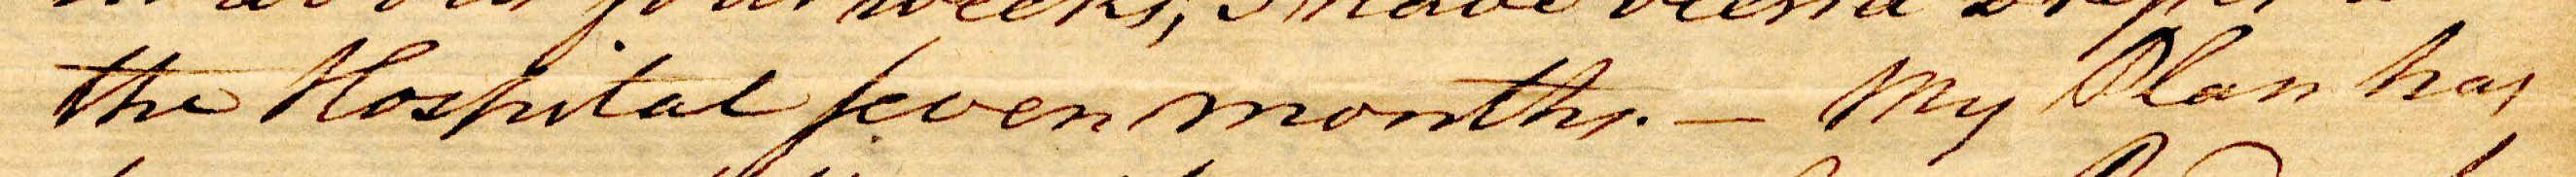the Hospital seven months.- My Plan has
